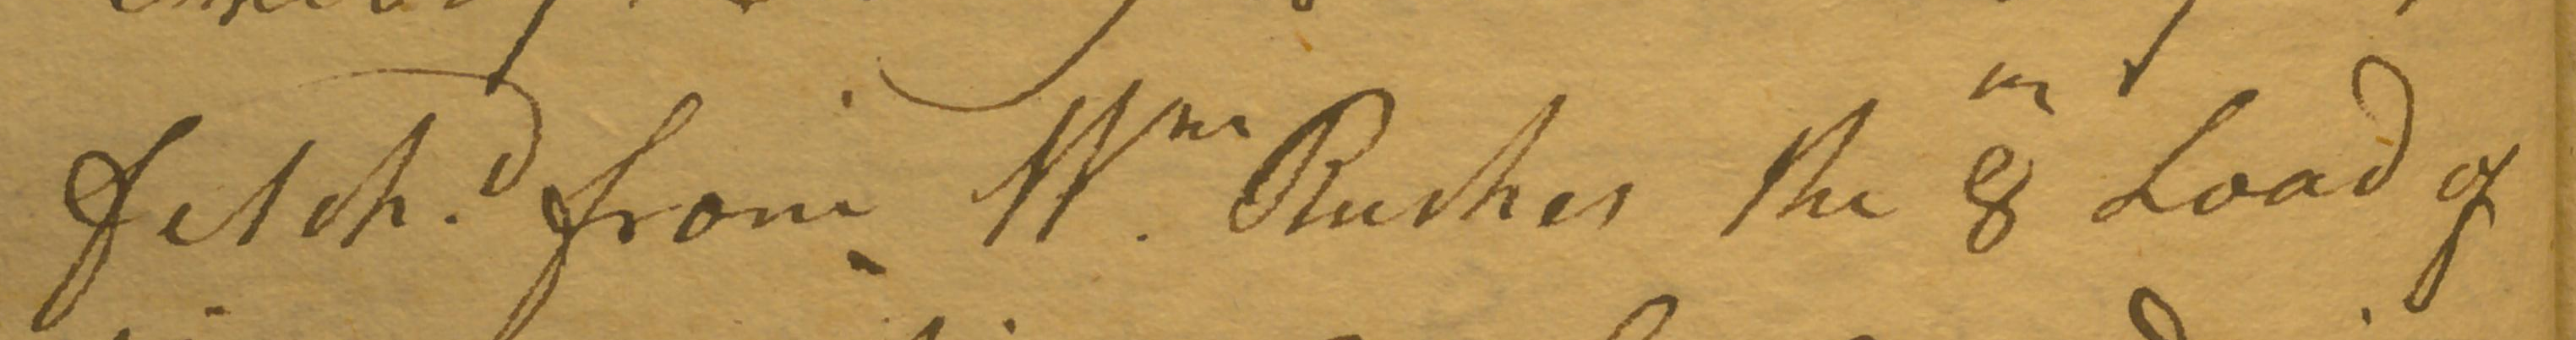fetch^d. from W^m. Rushes the 8^th Load of
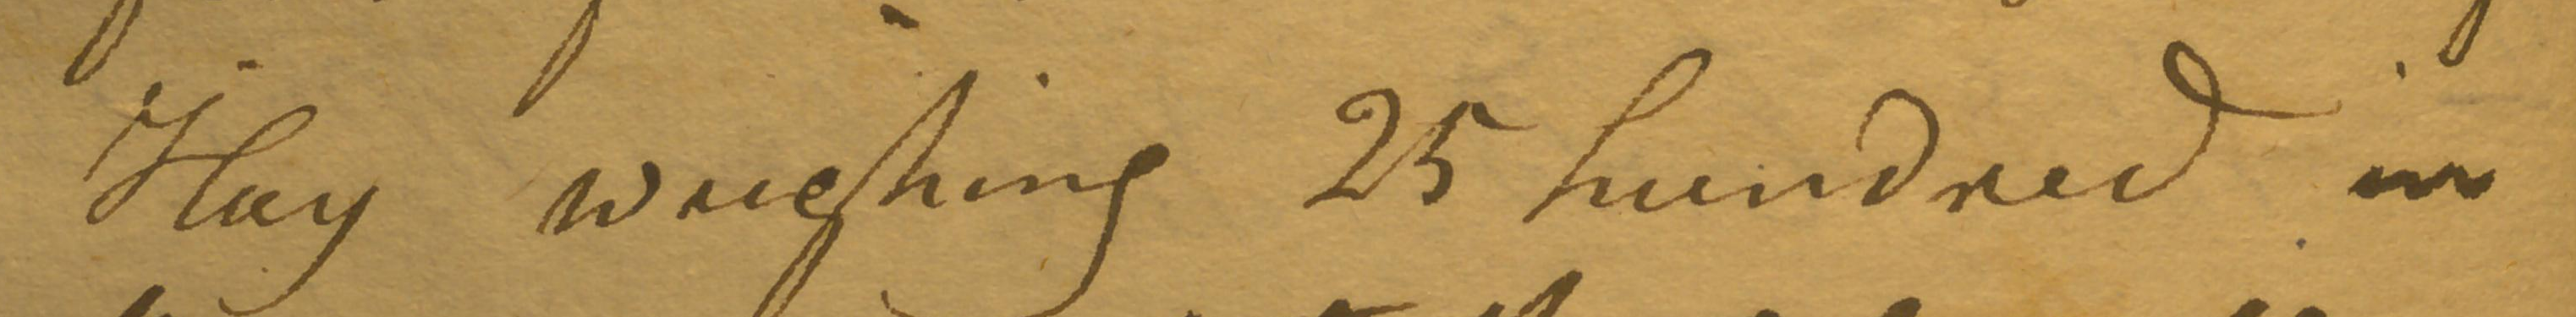Hay weighing 25 hundred in
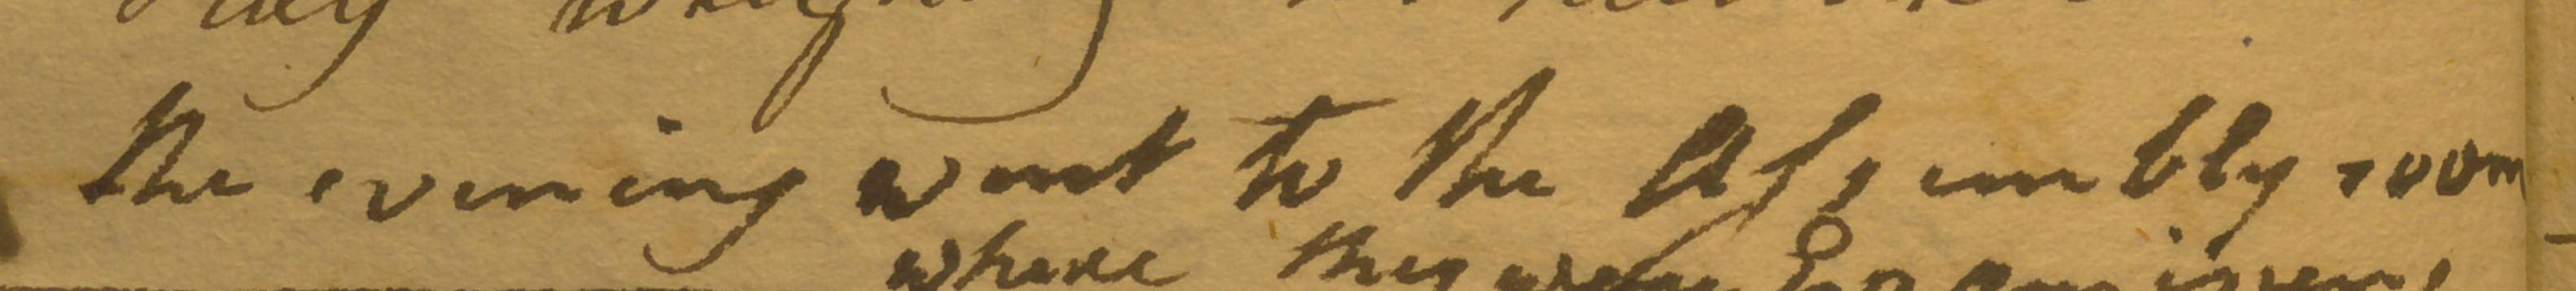the evening went to the Assembly roon
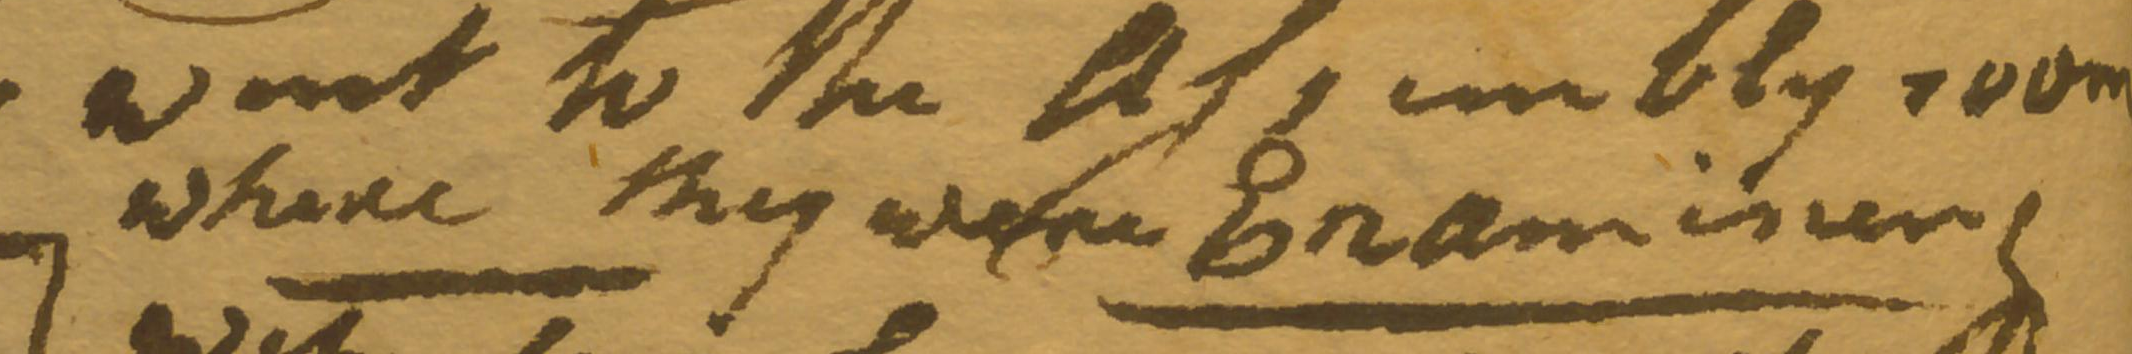where they were Examining
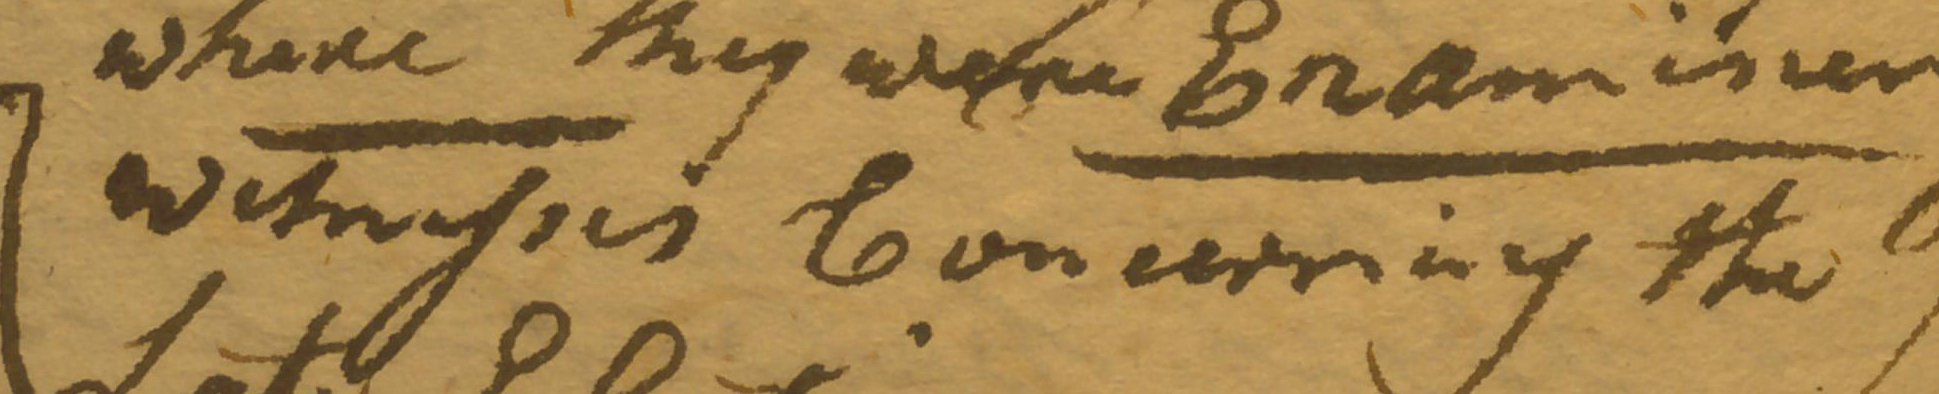witnesses Concerning the
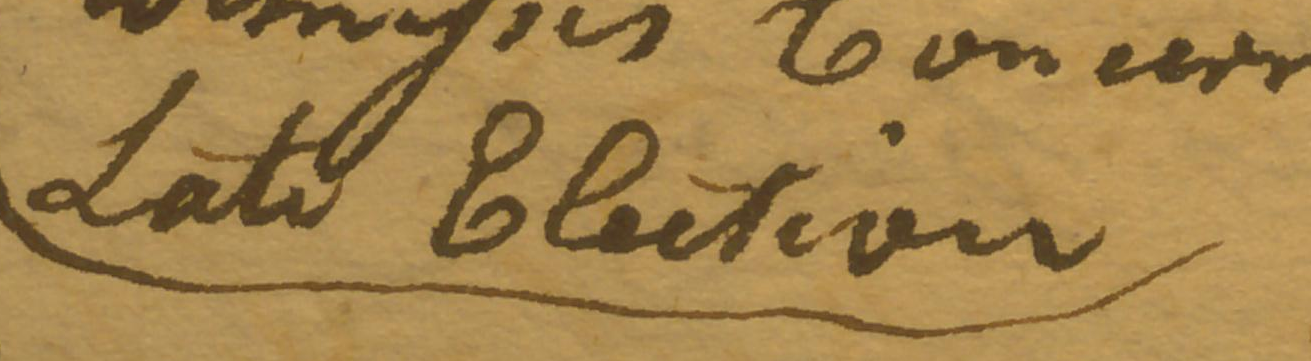Late Election
